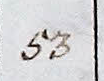53
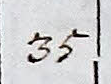35
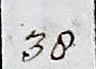38
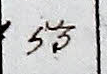53
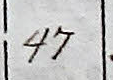47
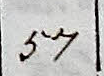57
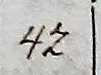42
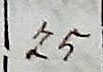25
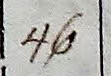46
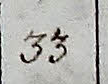33
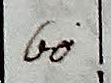60
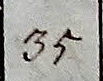35
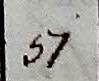57
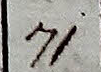71
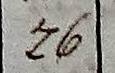26
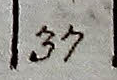37
